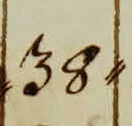38
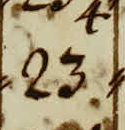23
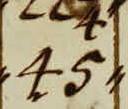45
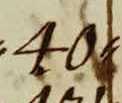40
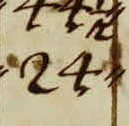24
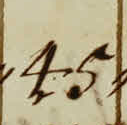45
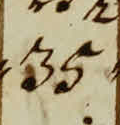35
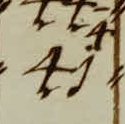41
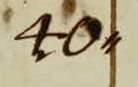40
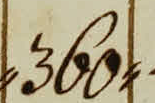360
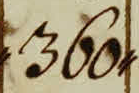360
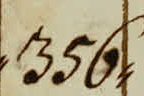356
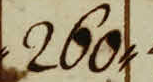260
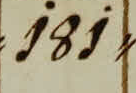181
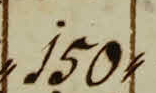150
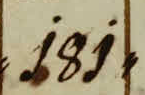181
